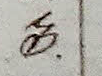3.
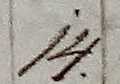14.
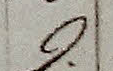9.
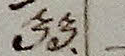33.
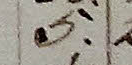5.
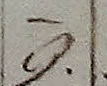9.
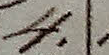4.
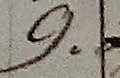9.
